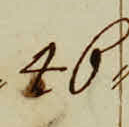46
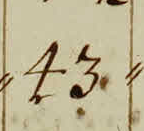43
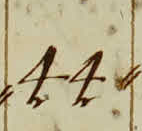44
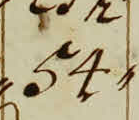54
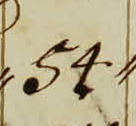54
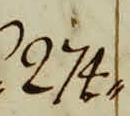274
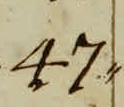47
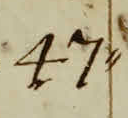47
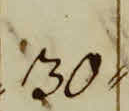30
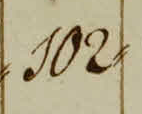102
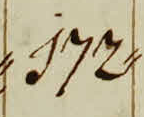172
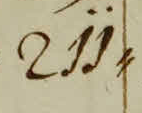211
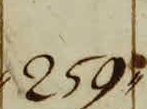259
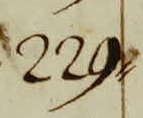229
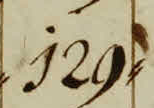129
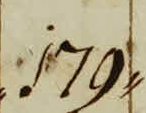179
